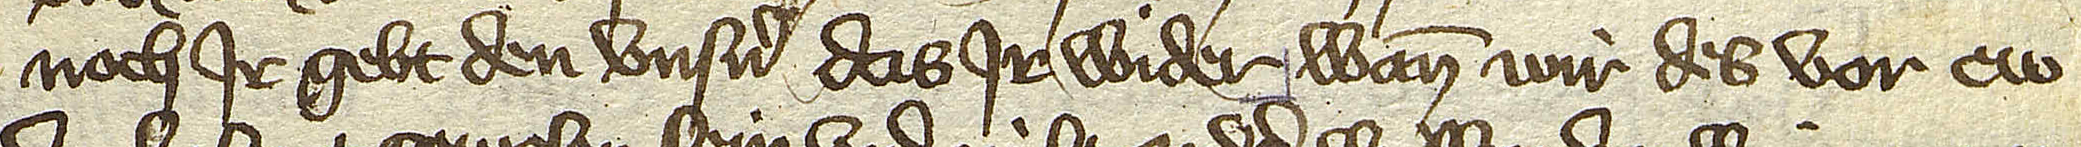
noch Ir gebt den vnſn* das Ir wider wan* wir des vor ew
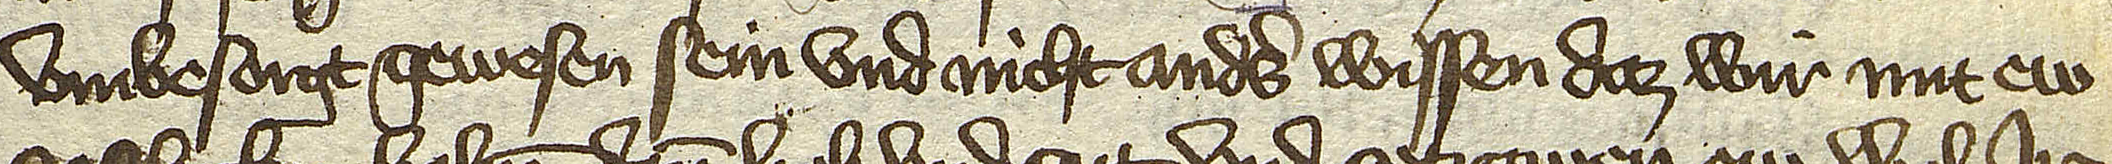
vmbeſorgt geweſen ſein vnd nicht ands* wiſſen daʒ wir mit ew
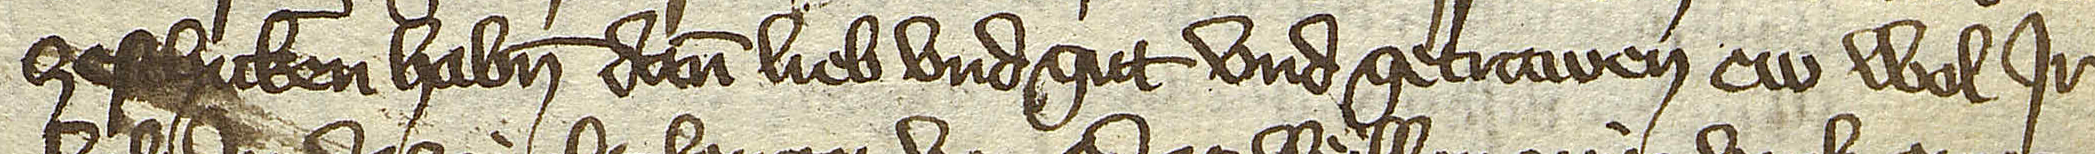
cʒeſchicken habn* dan* lieb vnd gut vnd getrawen ew wol Ir
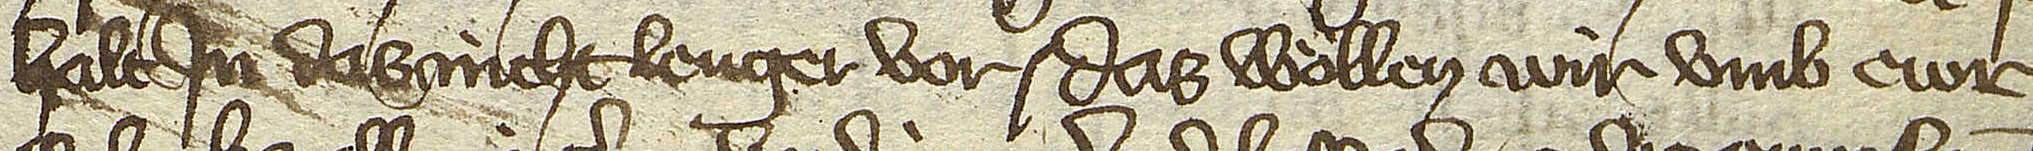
halt In das nicht lenger vor / das wöllen wir vmb ewr
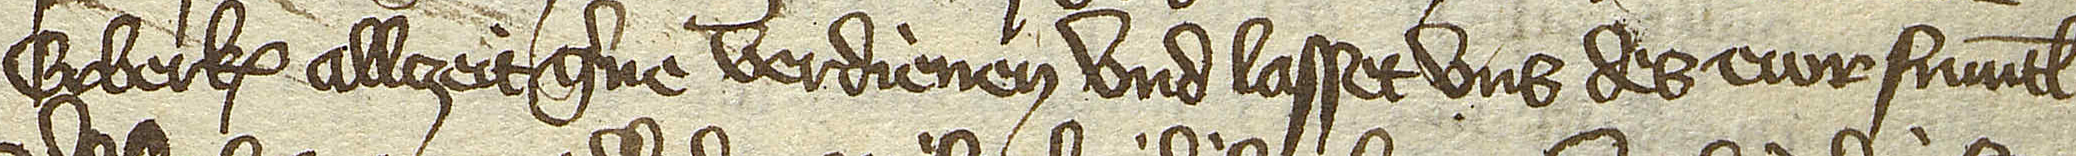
Erberk* allcʒeit g*ne verdienen vnd laſſet vns des ewr fruntl*
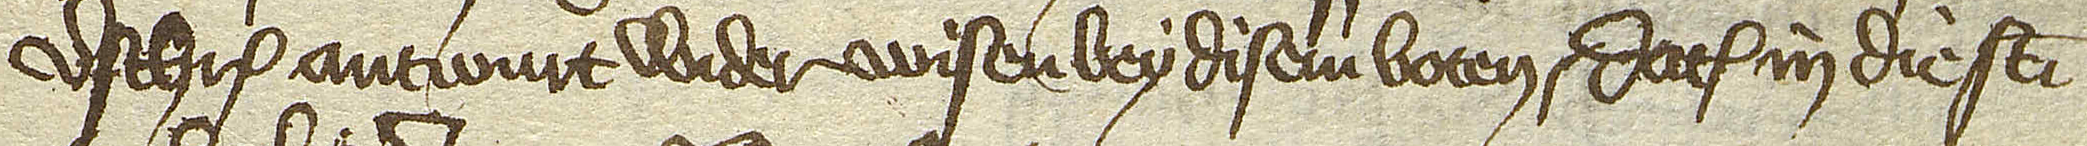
v*ſchr* antwurt* wider wiſen bey diſem boten / dat* in die ſci*
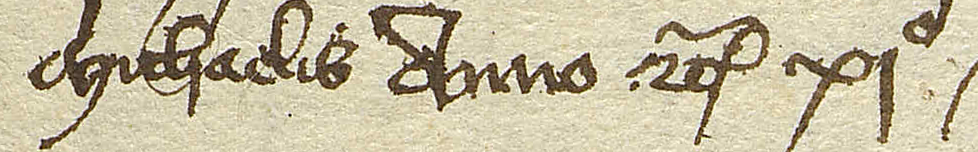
Michaelis Anno ec* xi* /
